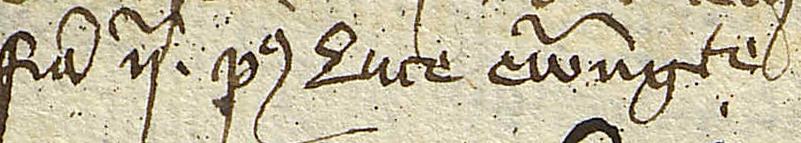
fia* ii* . p* Luce ewng* /
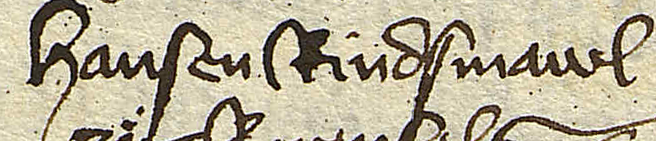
hanſen Rindſmawl
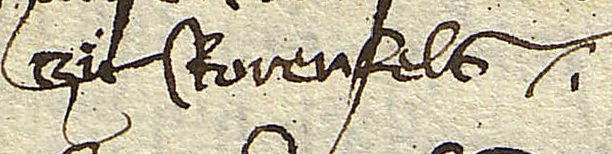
cʒü Rorenfels / .
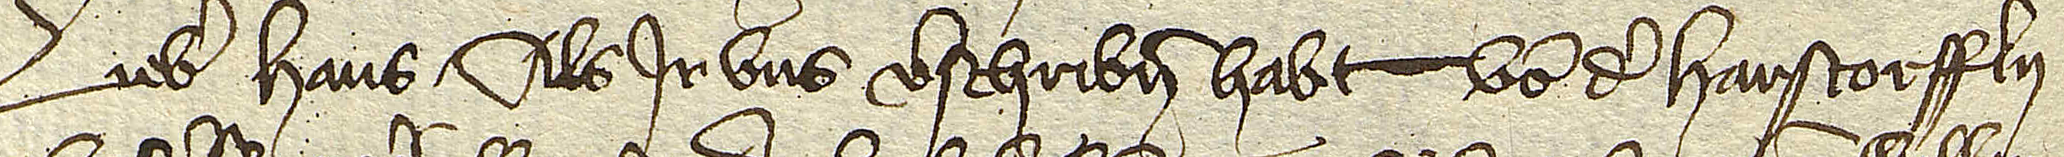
Lieb* hans / Als Ir vns v*ſchribn* habt vo* d* harſtorffln
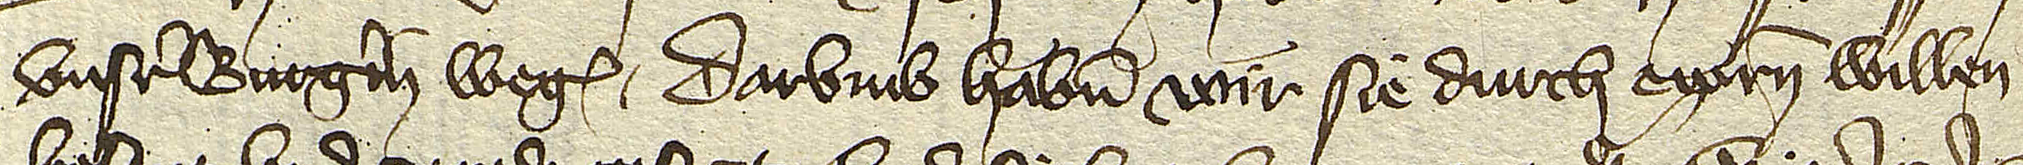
vnſr* Burg*in weg* / Darvmb habn* wir ſie durch ewrn* willen
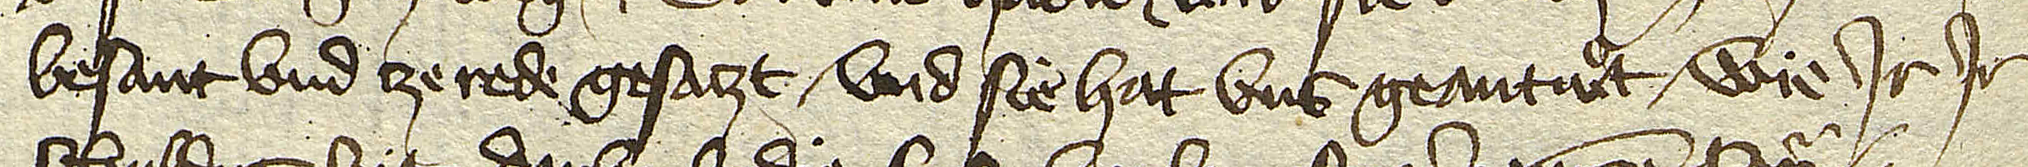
beſant vnd cʒe rede geſacʒt / vnd ſie hat vns geantwt* / wie Ir Ir
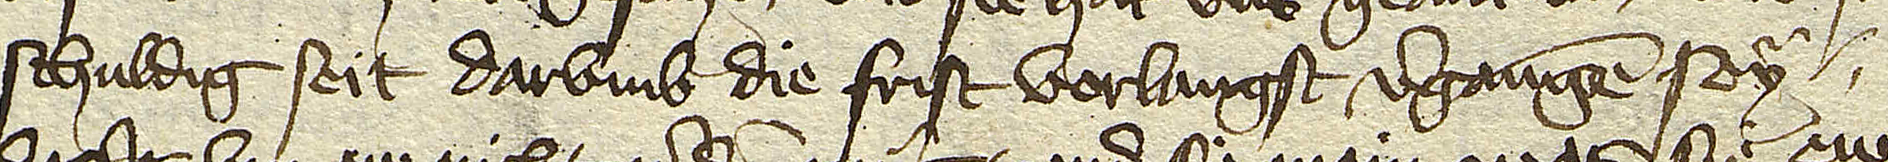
ſchuldig ſeit darvmb die friſt vorlangſt v*gange* ſey / .
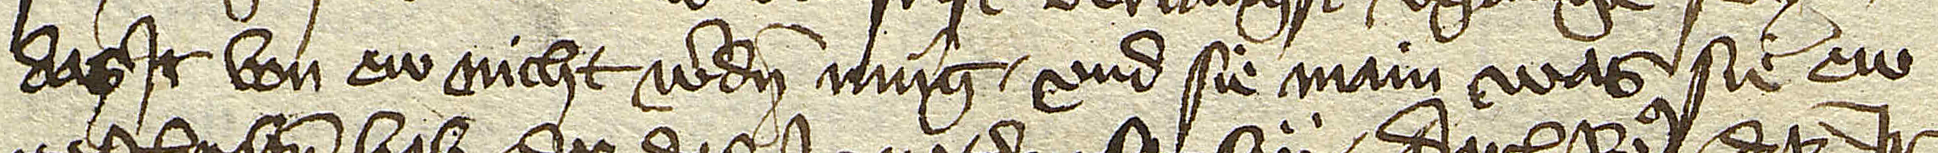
das Ir von ew nicht w*dn* mügt / vnd ſie main was ſie ew
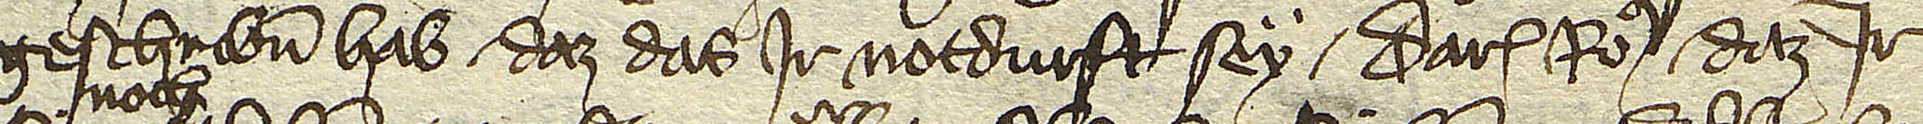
geſchribn* hab / daʒ das Ir notdurft ſey / Dar* Ro* / daʒ Ir
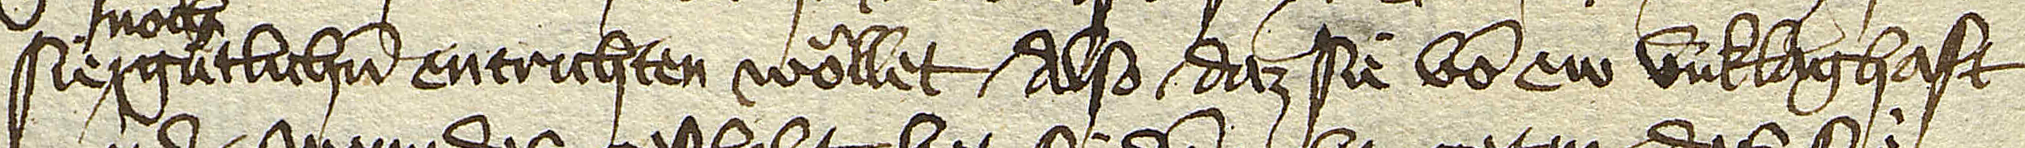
ſie gutlichn* entrichten wöllet / Alſo / daʒ ſie vo* ew vnklaghaft
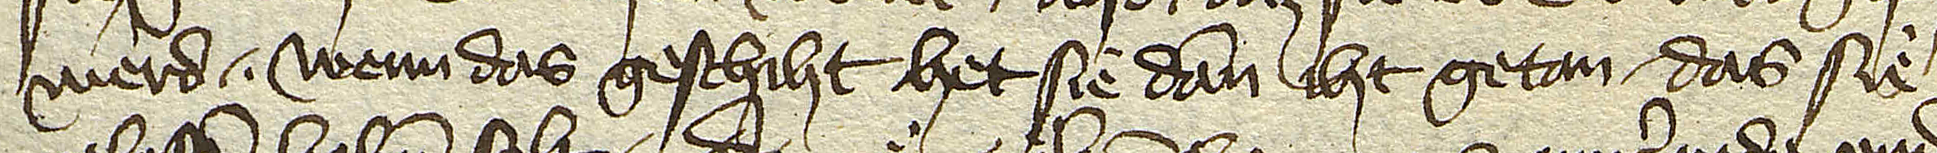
werd / . wenn das geſchiht het ſie dan* iht getan / das ſie
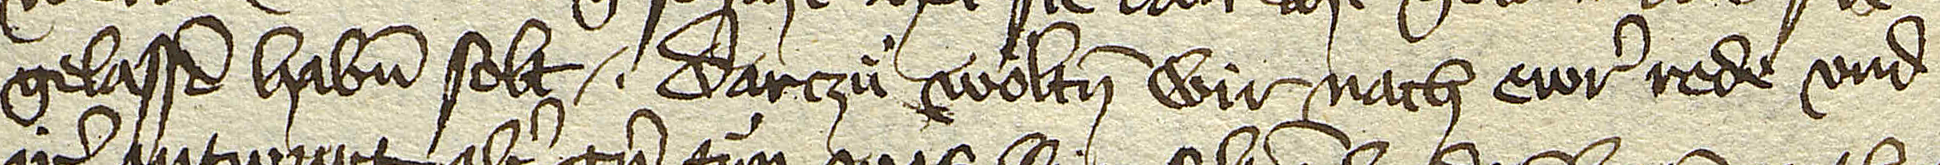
gelaſſe* habn* ſolt / . Darcʒü wöltn* wir nach ewr* rede vnd
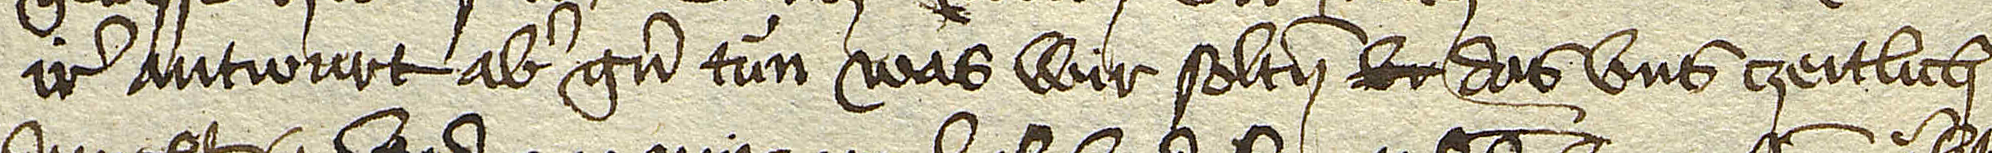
ir* antwurt ab* gn* tün was wir ſoltn* vr das vns cʒeitlich
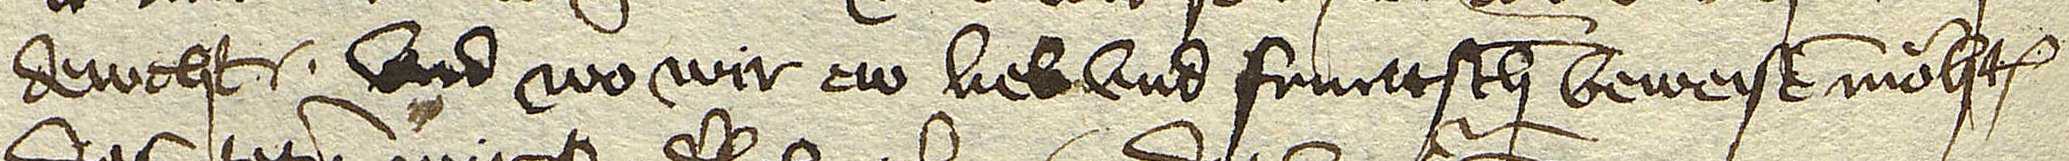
dewcht / . vnd wo wir ew lieb vnd fruntſch* beweiſe* möht*
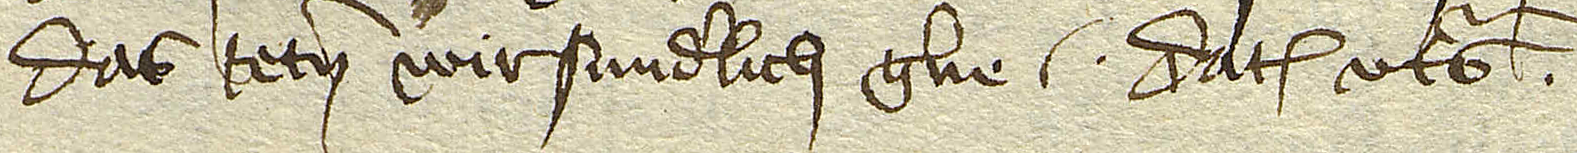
das tetn* wie ſund*lich g*ne / . Dat* vts* .
